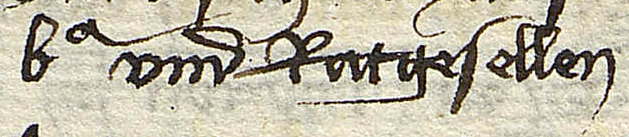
b* vnd Ratgeſellen
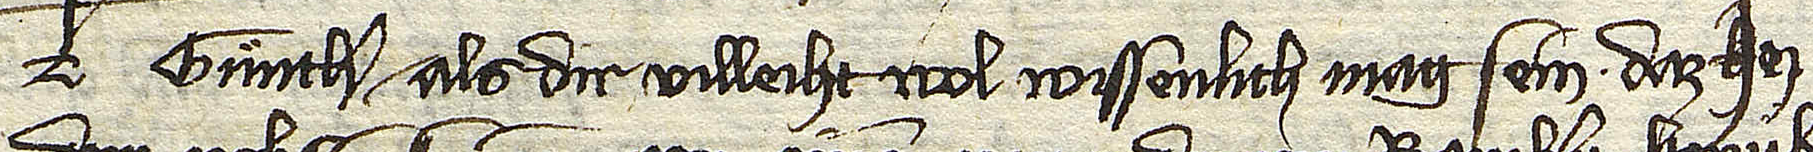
L* Günth* / als dir villeicht wol wiſſentlich mag ſein . daʒ In
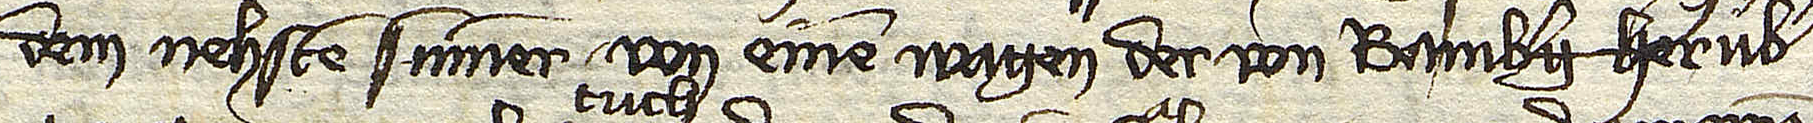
dem nehſte* ſu*mer / von eine* wagen der von Bamb*g herüb*
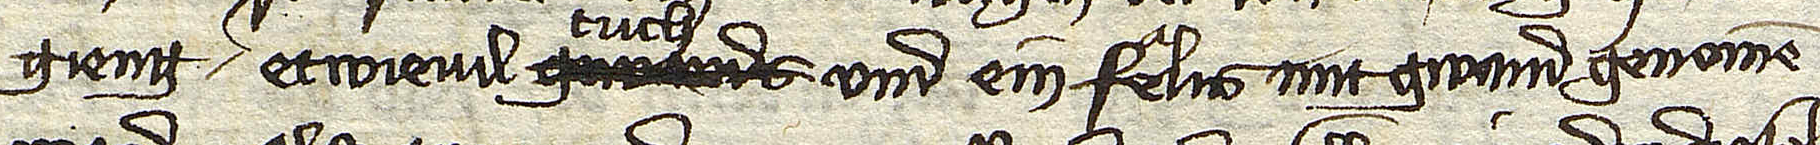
gieng / etwieuil gewands vnd ein fëlns mit gwand genome*
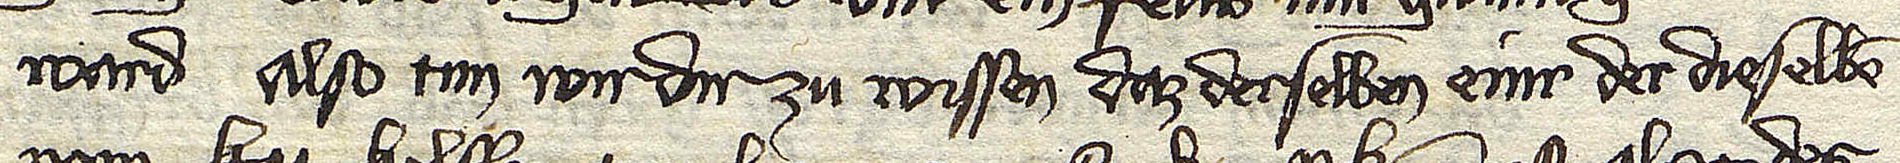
ward Alſo tun wir dir ʒu wiſſen daʒ derſelben einr der dieſelbe*
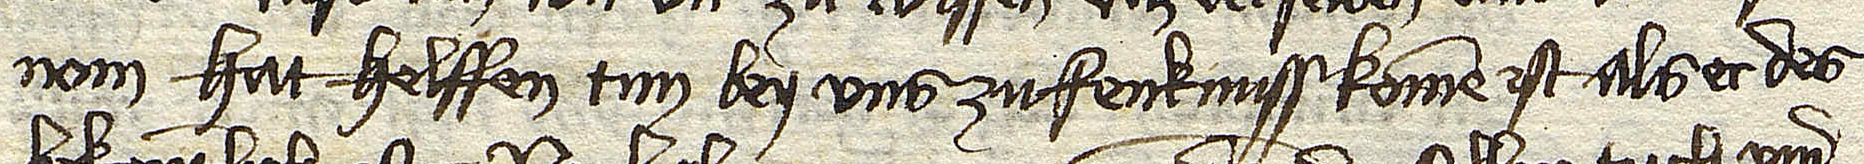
nom hat helffen tun bey vns ʒu fenknuſſ kome* iſt / als er des
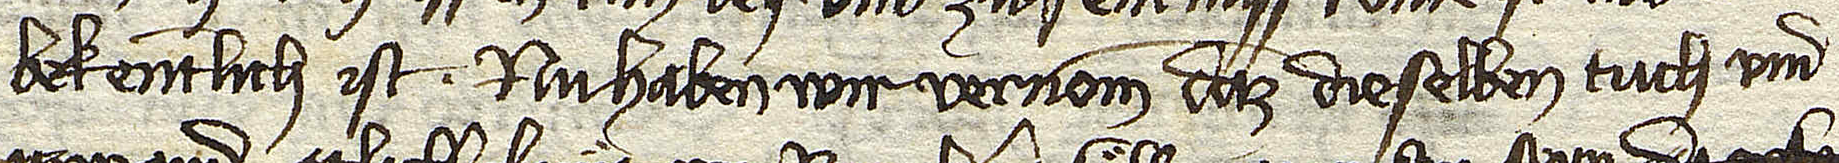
beken*tlich iſt . Nu haben wir vernom* daʒ dieſelben tuch vnd
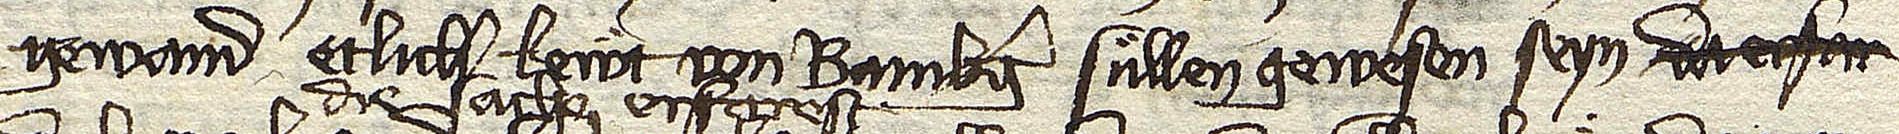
gewand etlich* lewt von Bamb*g ſüllen geweſen ſeyn da erfar
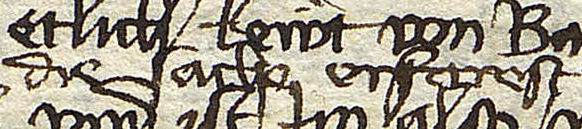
die ſache erfareſt
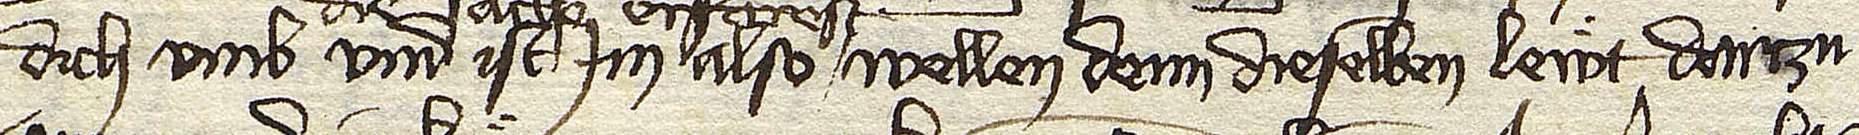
dich vmb vnd iſt Im alſo wellen denn dieſelben lewt darcʒu
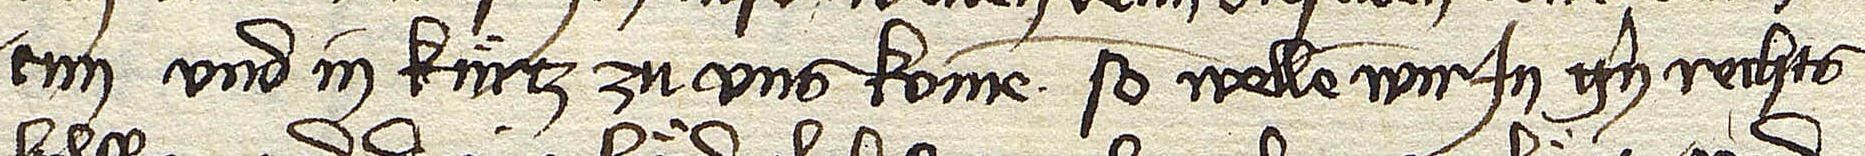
tun vnd in kürcʒ ʒu vns kome* . ſo welle* wir In g*n rechts
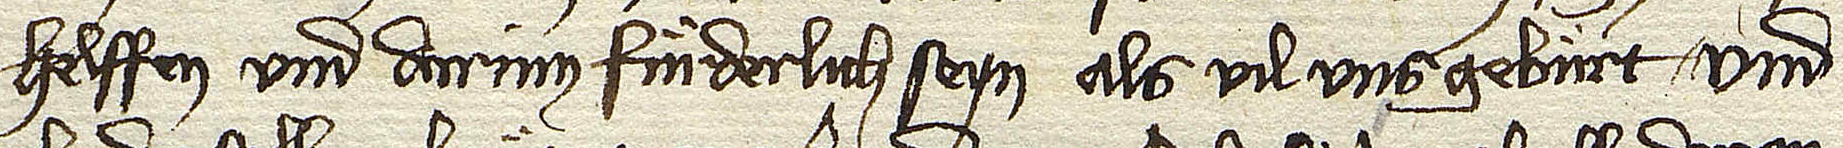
helffen vnd darinn fürderlich ſeyn als vil vns gebürt / vnd
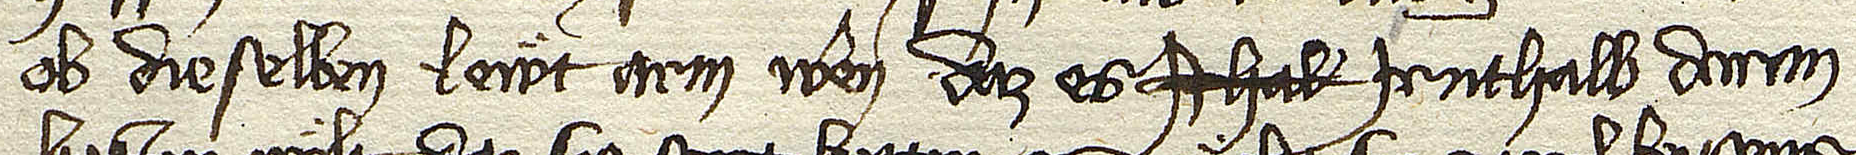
ob die ſelben lewt arm w*en . daʒ es Ir hal Irnthalb daran
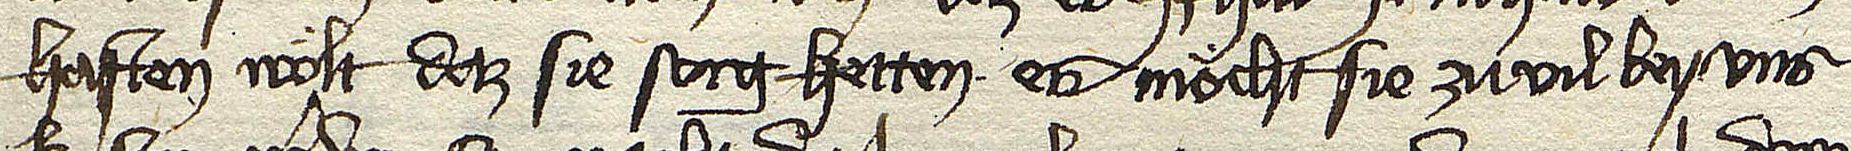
haften wölt daʒ ſie ſorg hetten . es möcht ſie ʒu vil bey vns
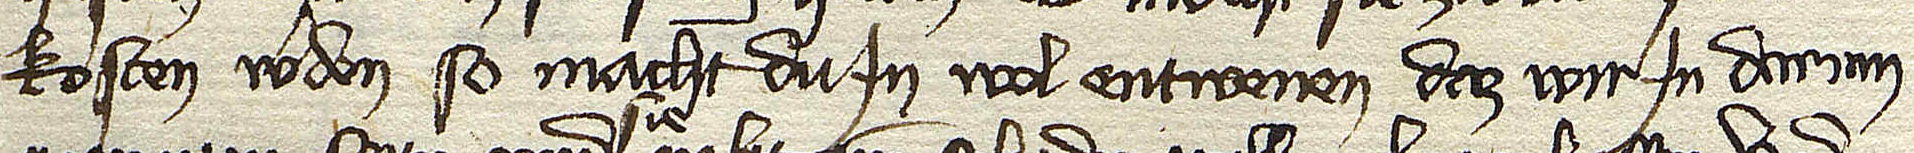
koſten w*den ſo macht du In wol entwenen daʒ wir In darum
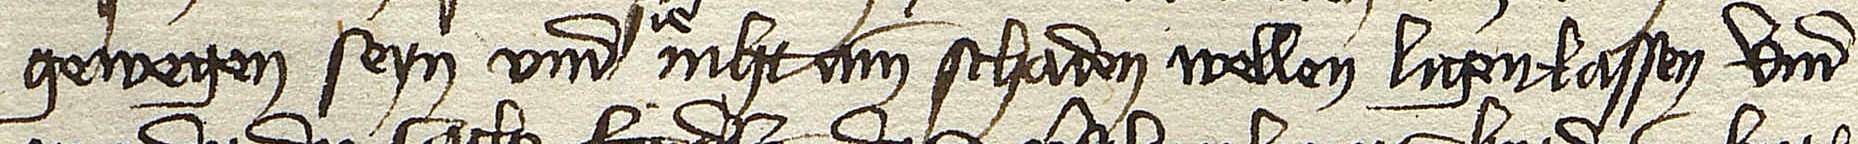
gewegen ſeyn vnd niht am ſchaden wellen ligen laſſen Vnd
